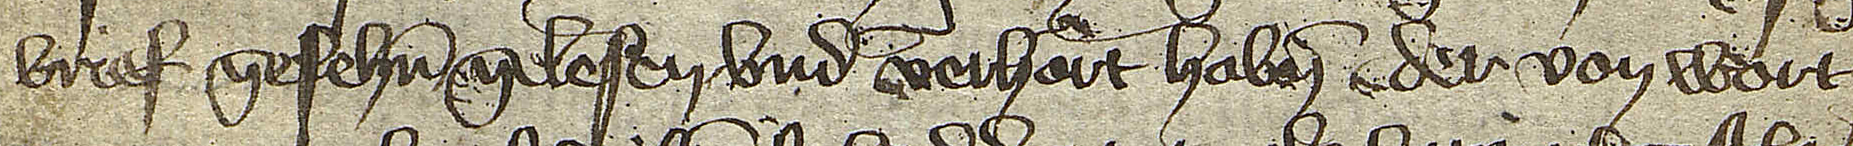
brief geſehn* geleſen vnd verhört habn* / der von wort
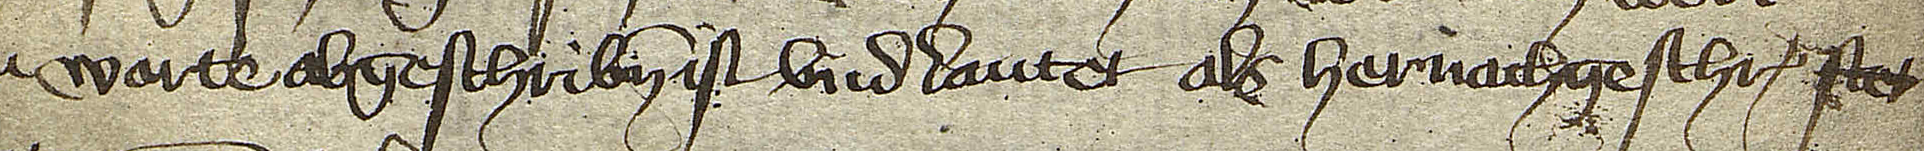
cʒu worte abgeſchribn* iſt vnd lautet als hernachgeſchr* ſtet
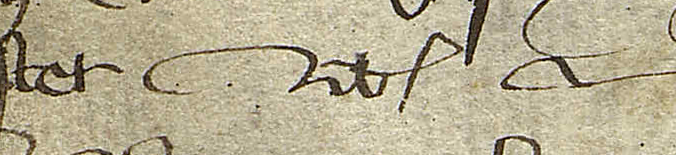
ſtet %% %
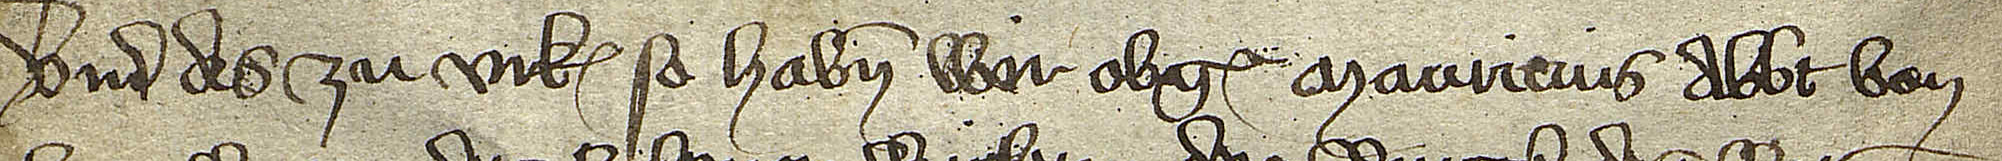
Vnd des cʒu vrk* ſo habn* wir obg* Mauricius Abbt von
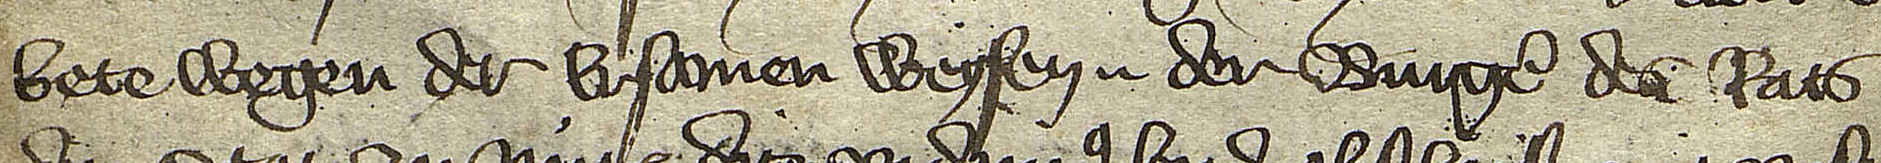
bete wegen der Erſamen weyſen ~ der Burge* des Rats
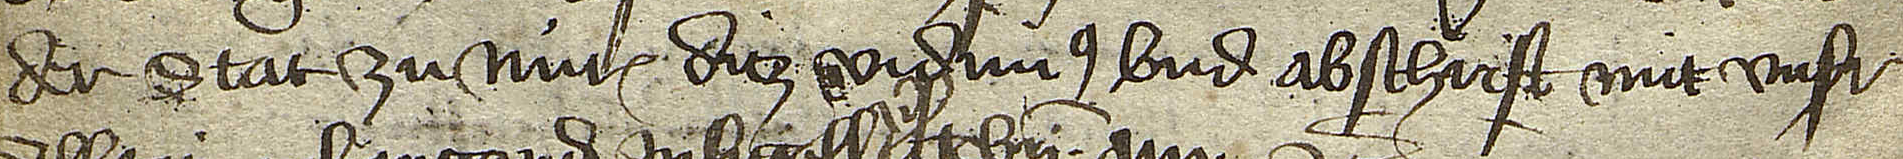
der Stat cʒu Nür* dicʒ vidim* vnd abſchrift mit vnſ*r
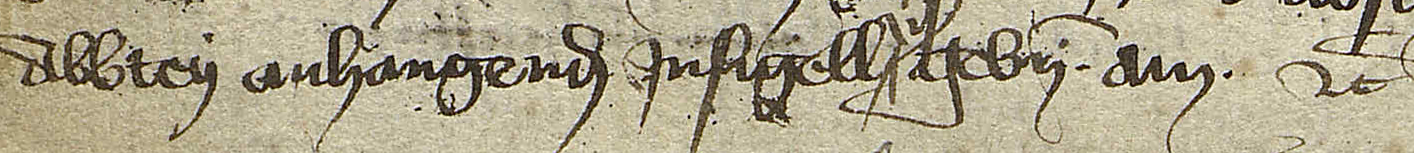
Abbtey anhängend* Inſigell gebn* . am . ec*
